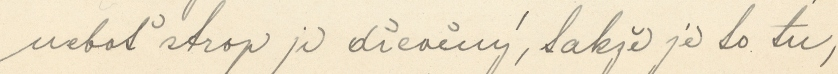neboť strop je dřevěný, takže je to tu,
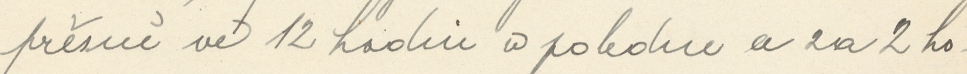přesně ve 12 hodin v poledne a za 2 ho-
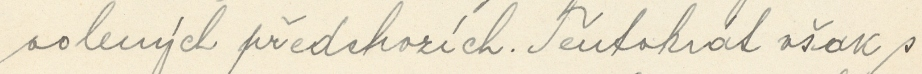volených předchozích. Tentokrát však s
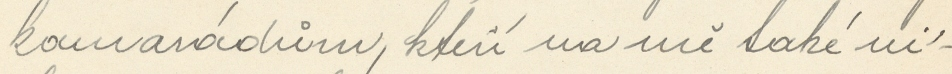kamarádům, kteří na mě také ni-
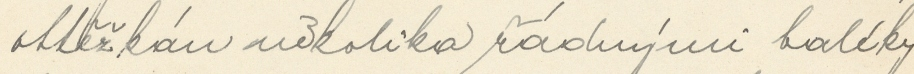obtěžkán několika řádnými balíky
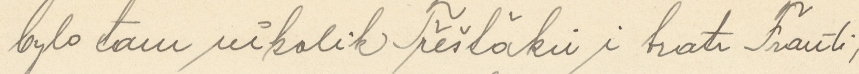bylo tam několik Třešťaků i bratr Franti-
